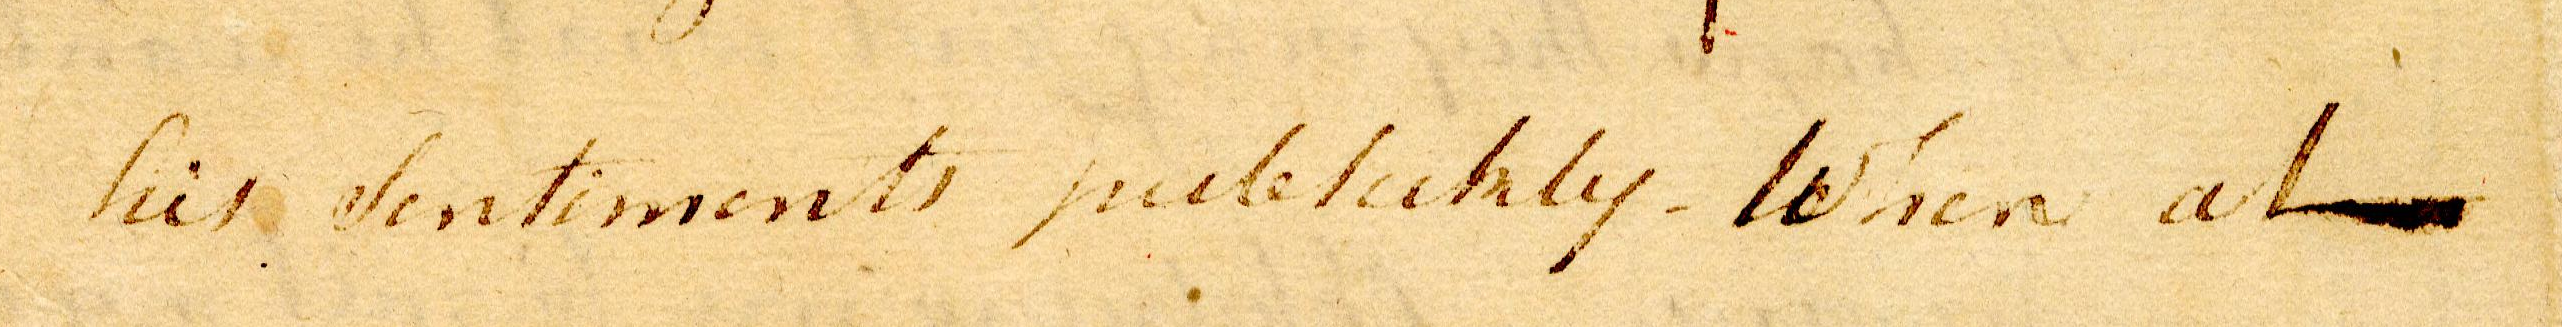his Sentiments publickly. When a
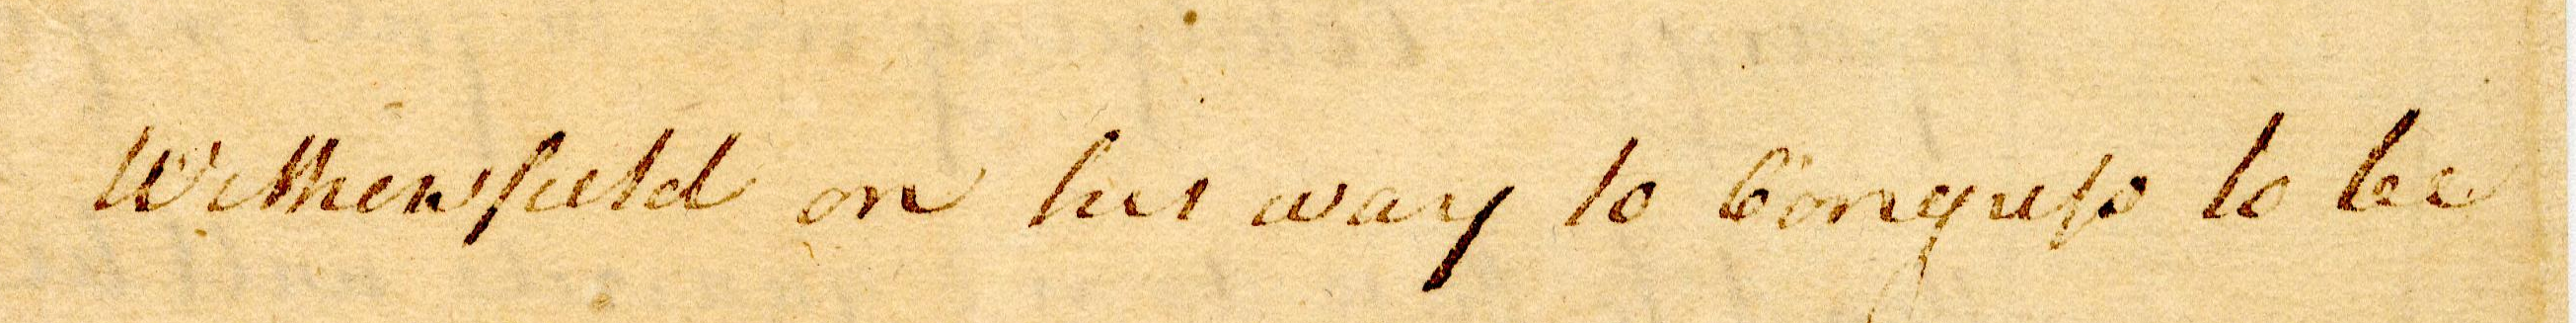W. Mansfield on his way to Congress to be
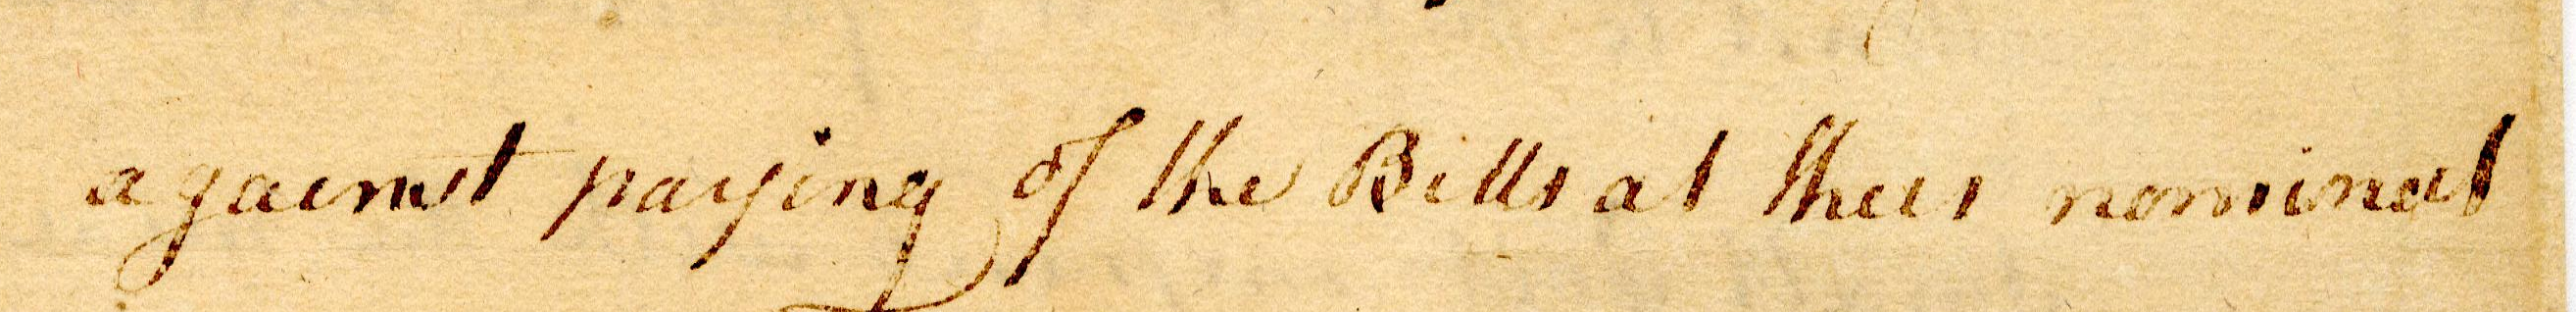against paying of the Bills at their nominal
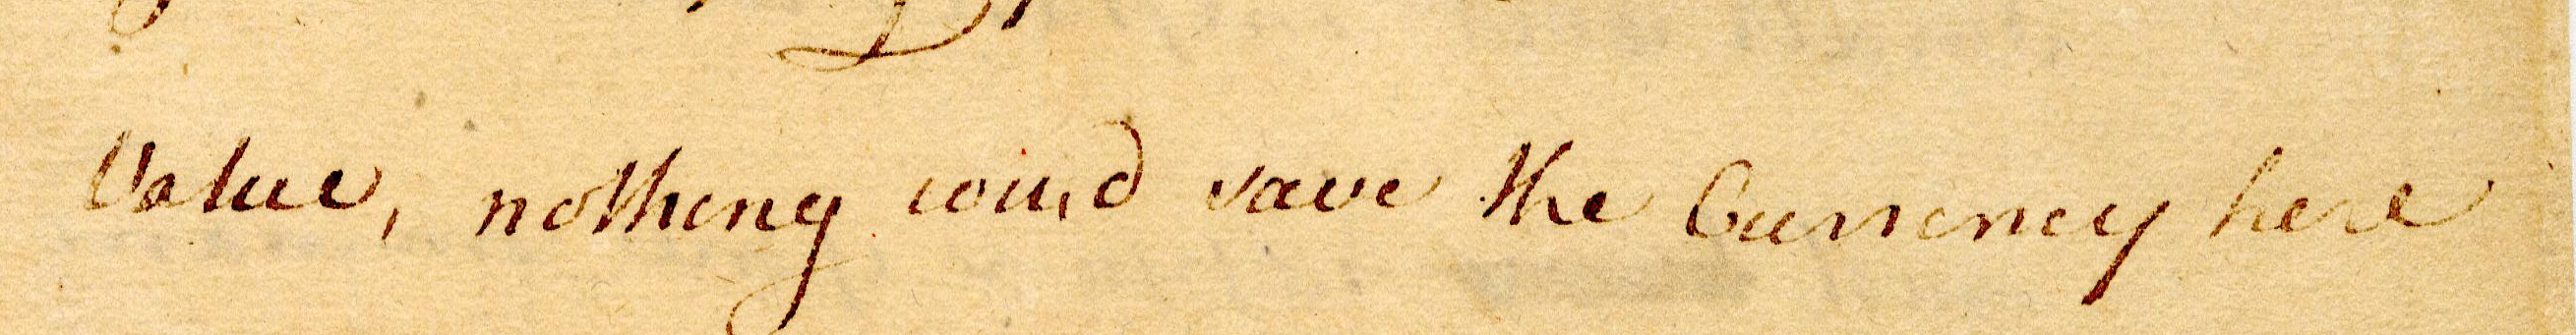Value, noting coud save the Currency here
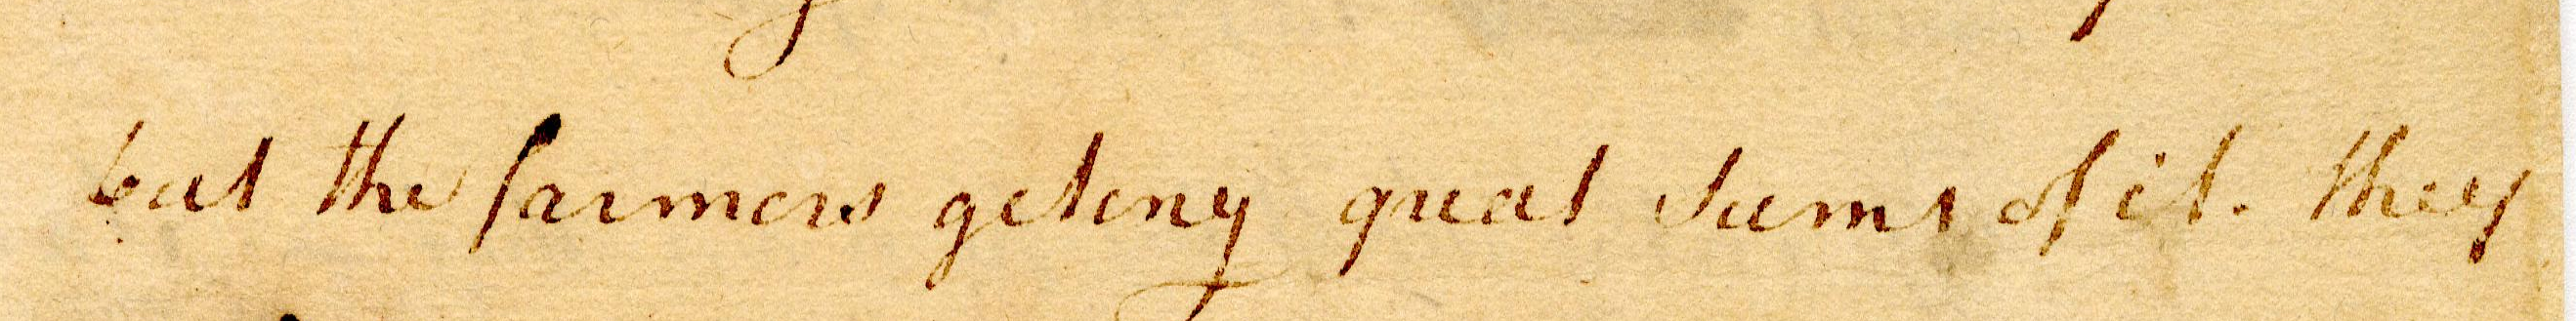but the farmers geting great sums of it. they
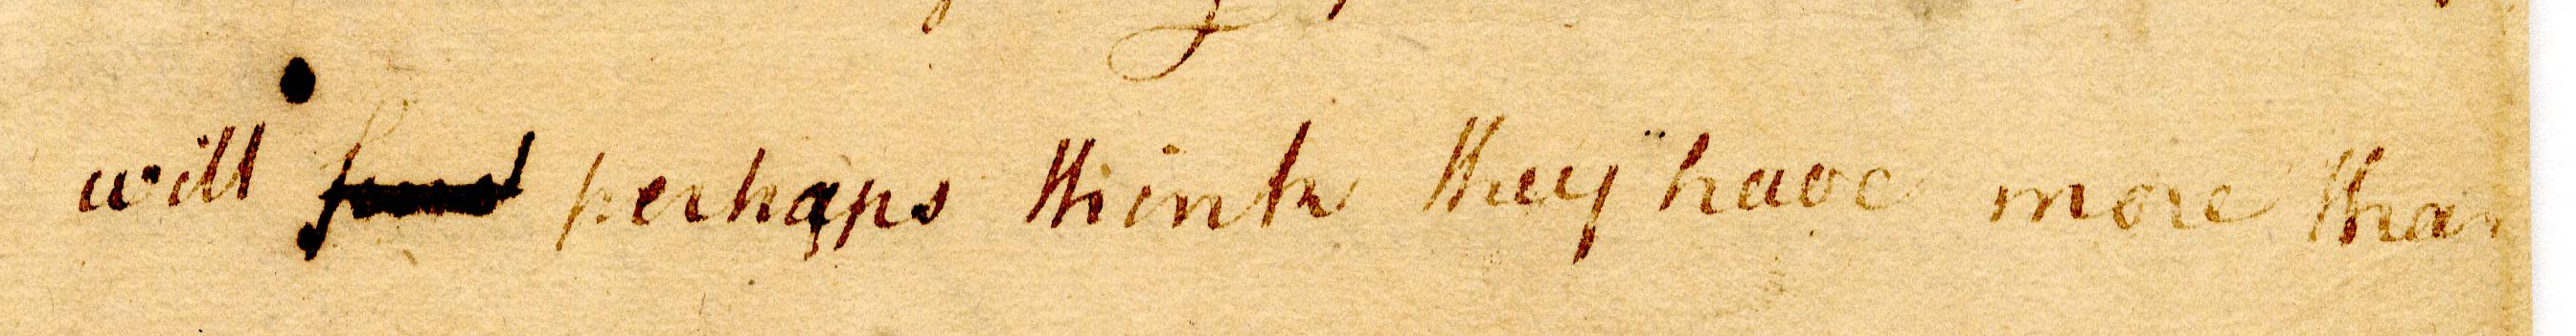will [____] perhaps think they have more than
